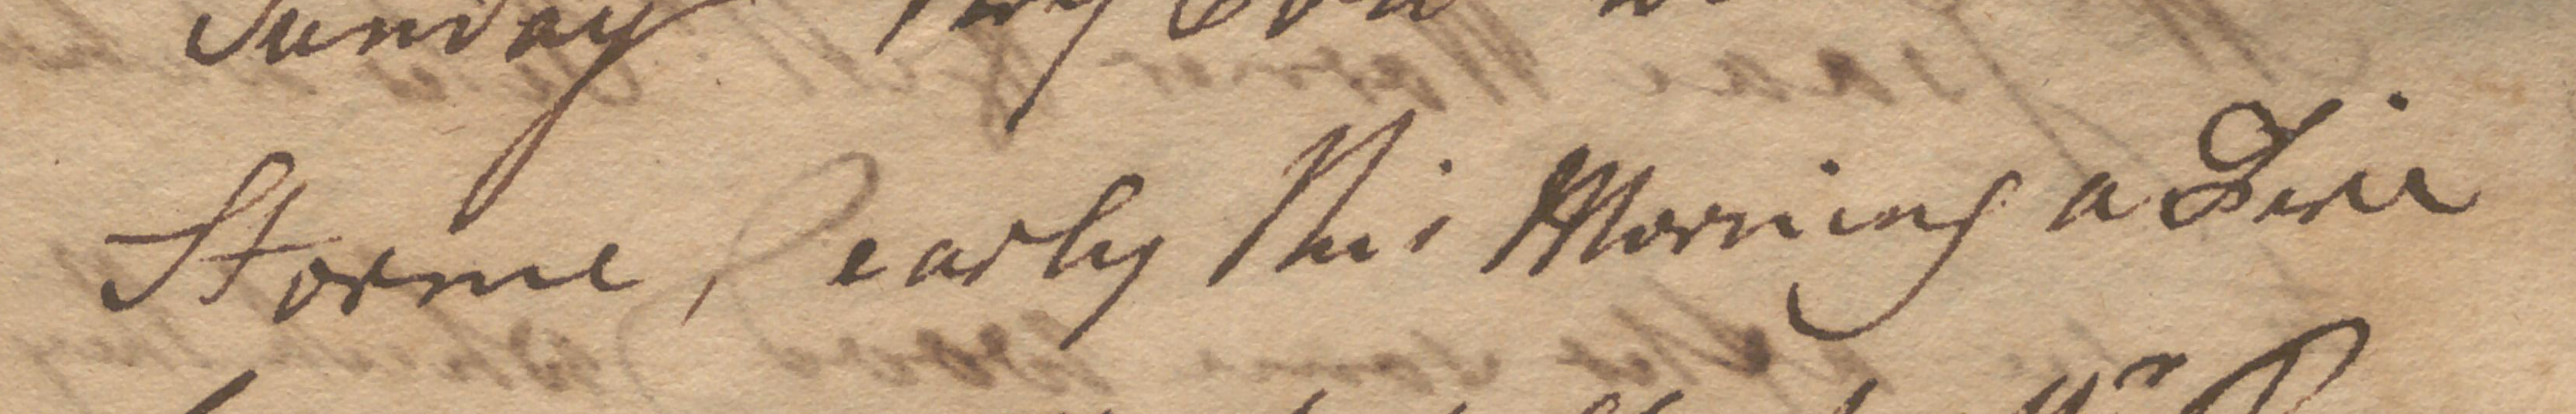Storme, early this Horing a Fire
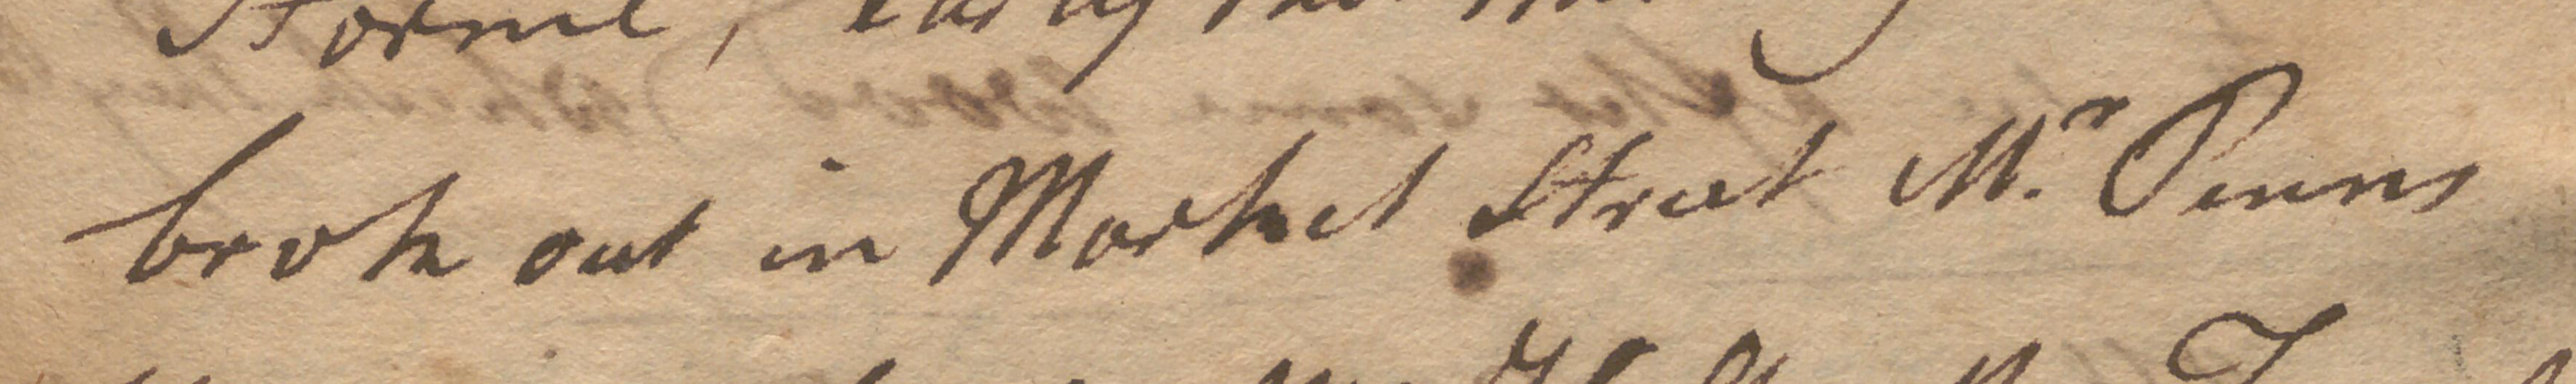brok out in Market Street M^r. Penns
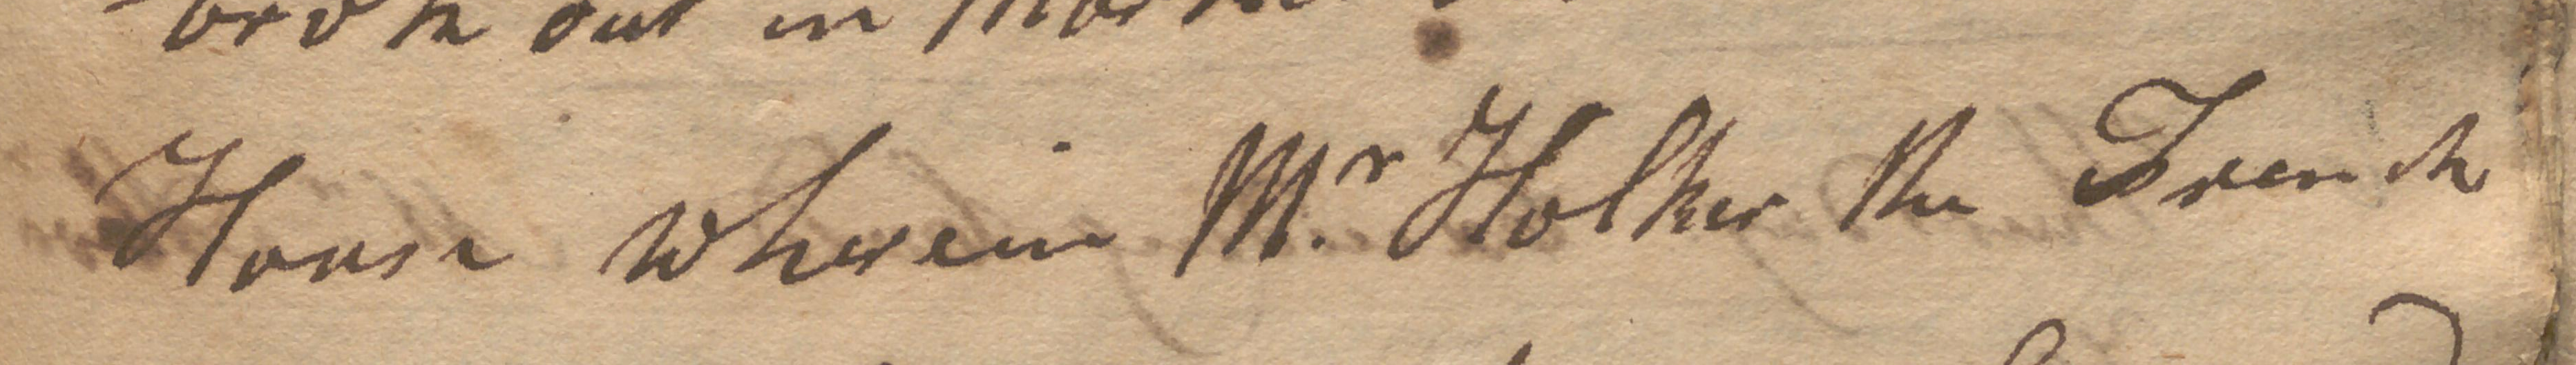House wherein M^r. Holker the French
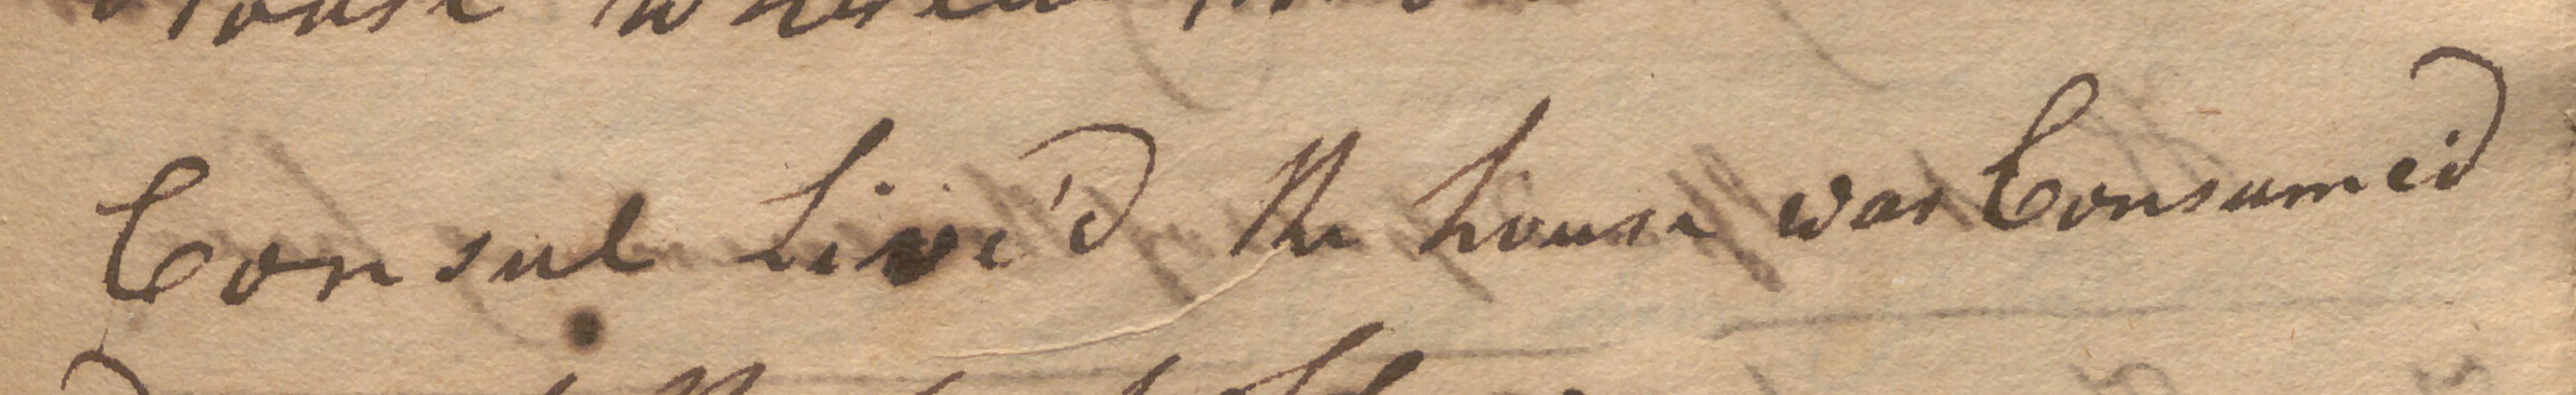Consul Live'd - the house was Consumed
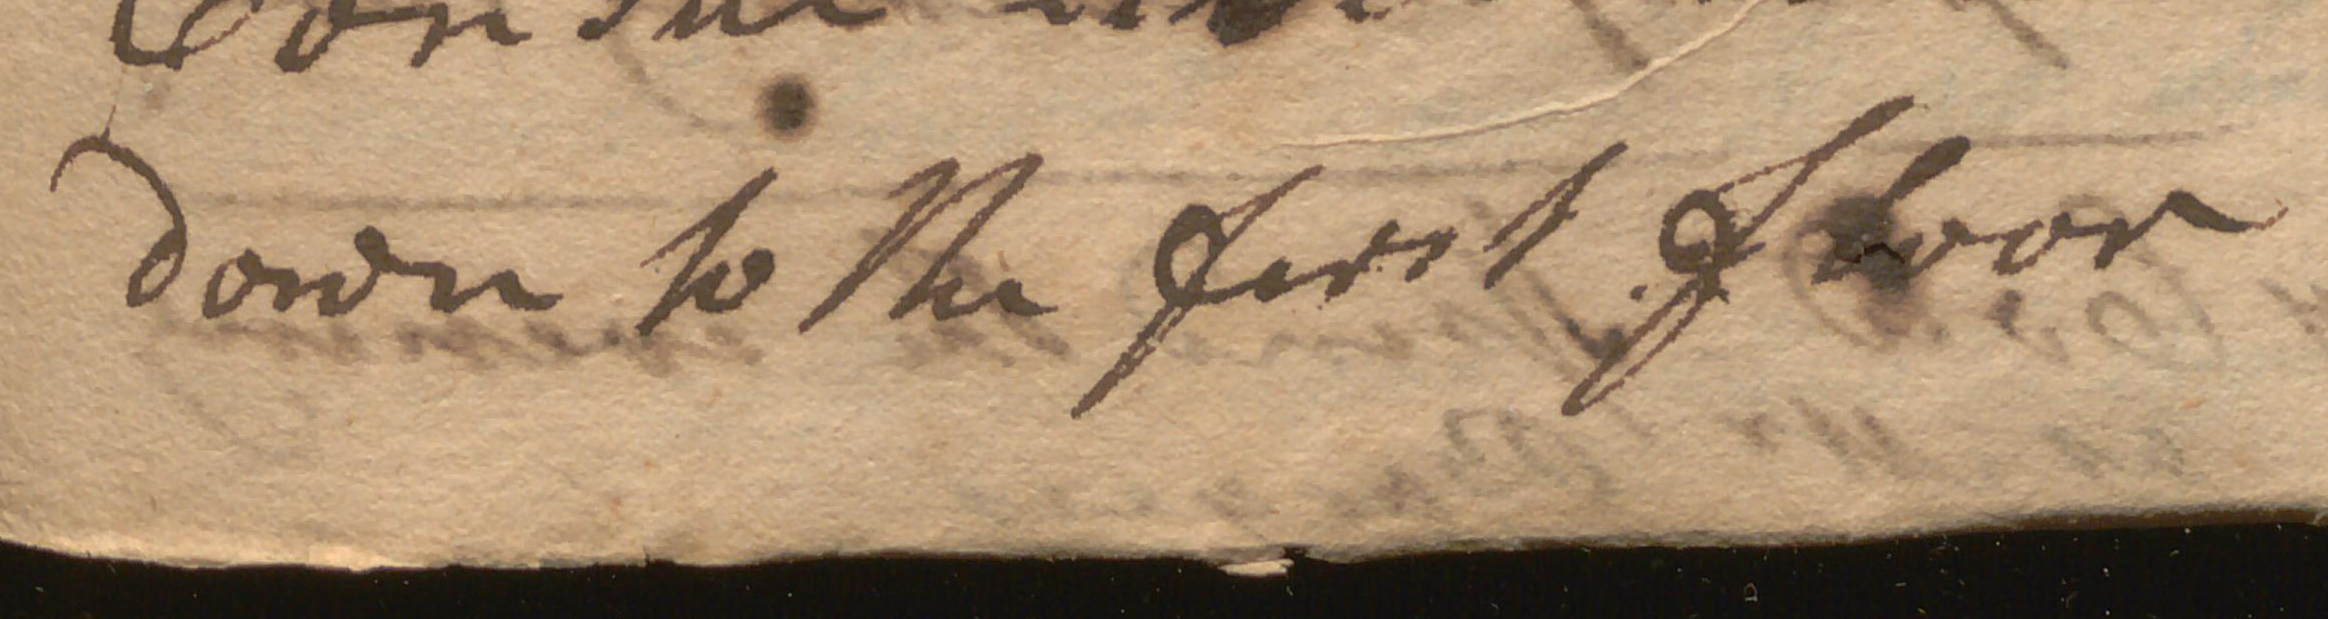down to the first floor
